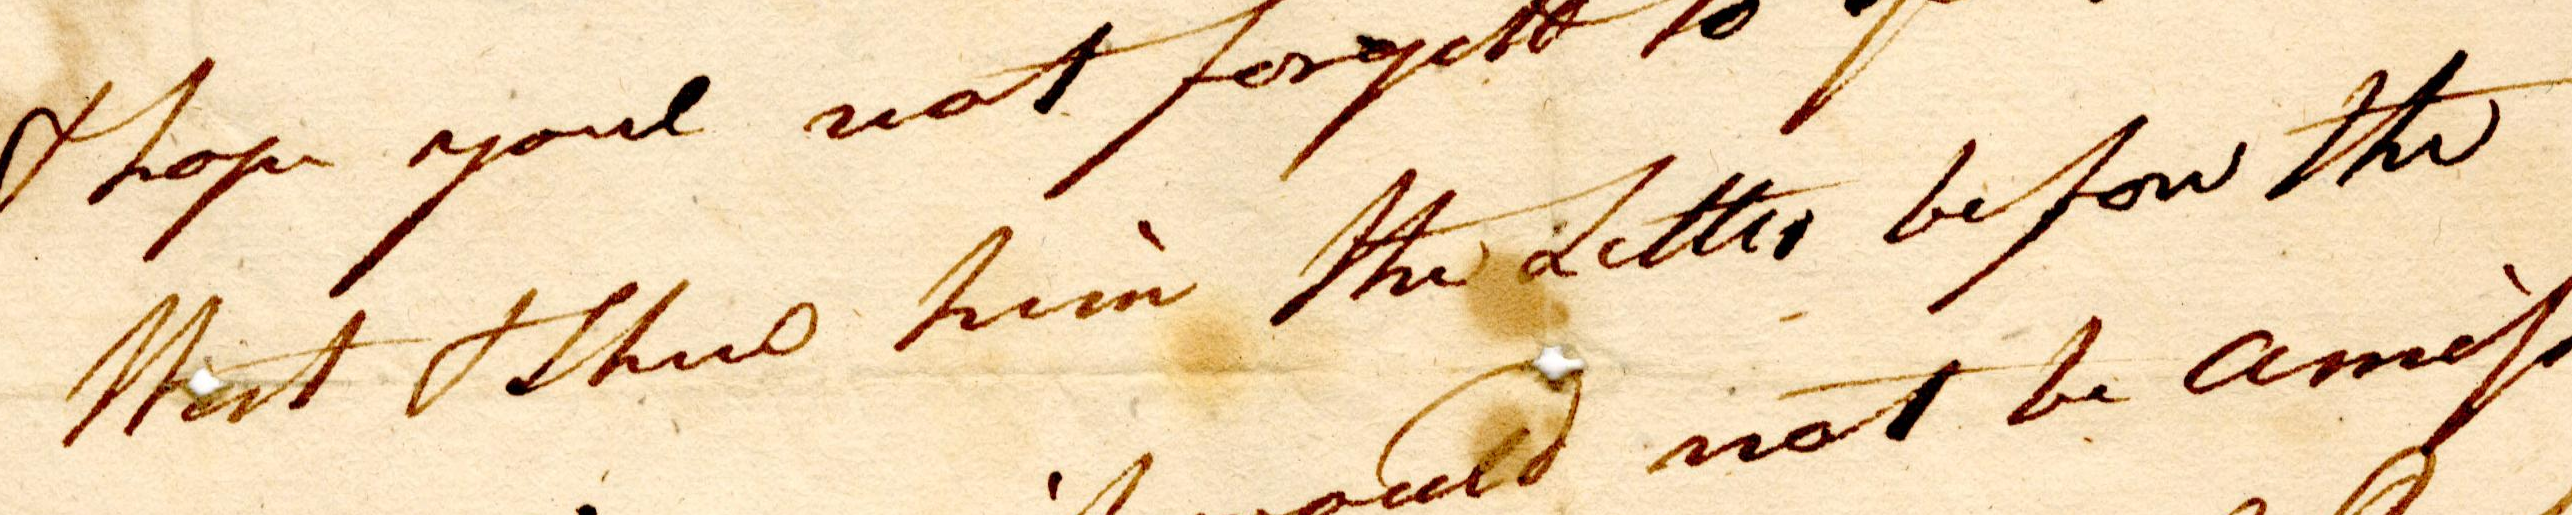Met & shew him the letter before the
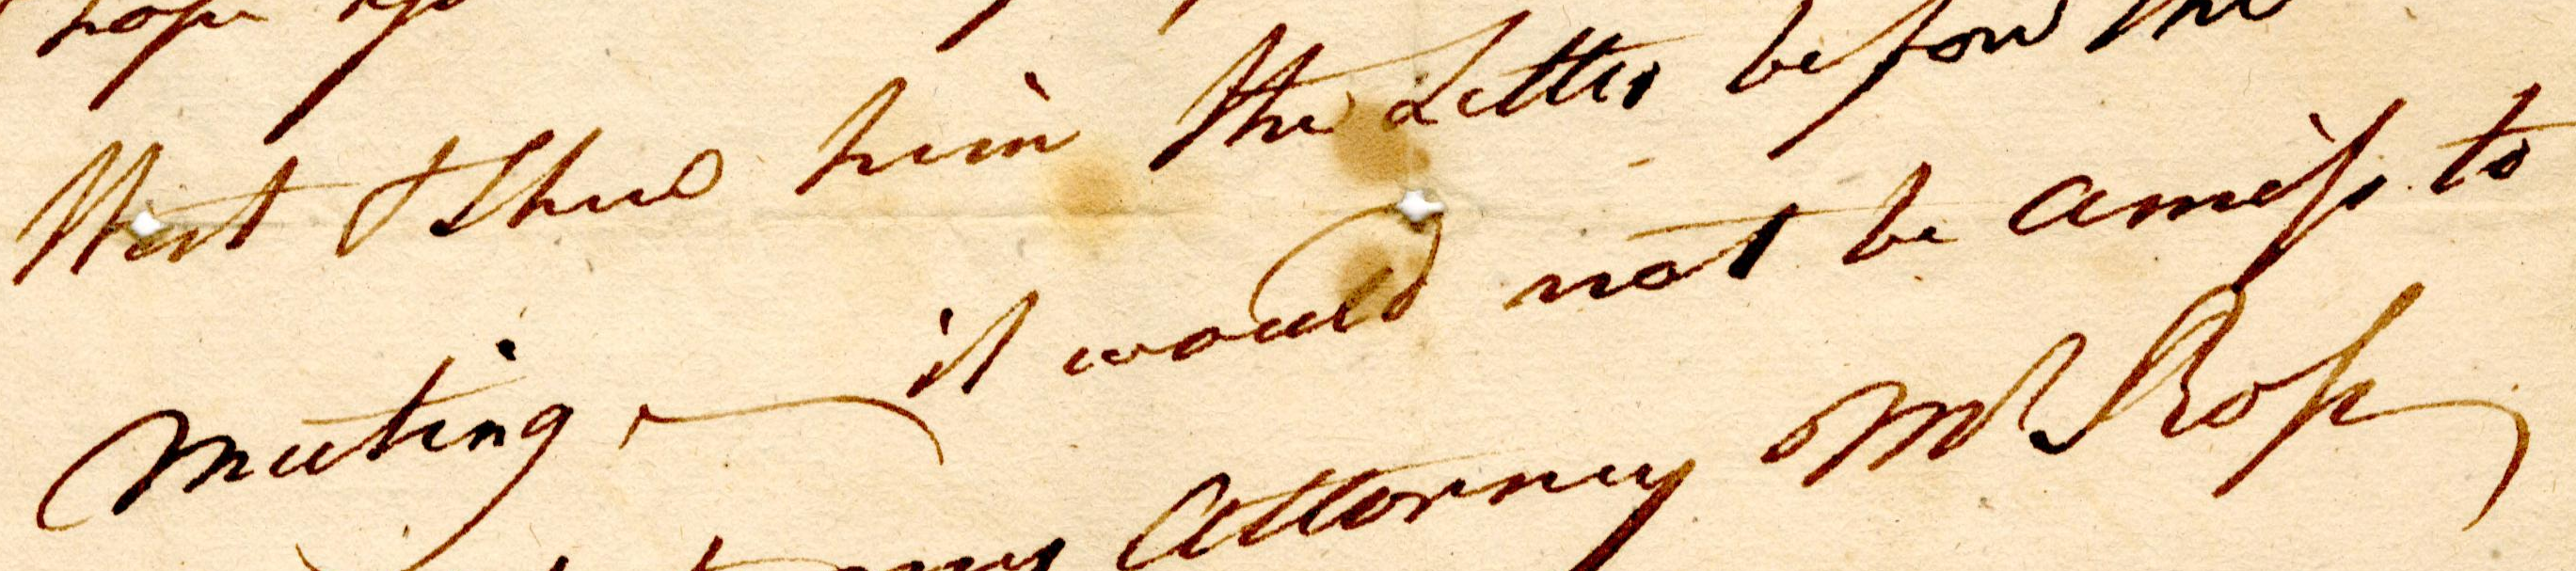Meeting.- It would not be a miss to
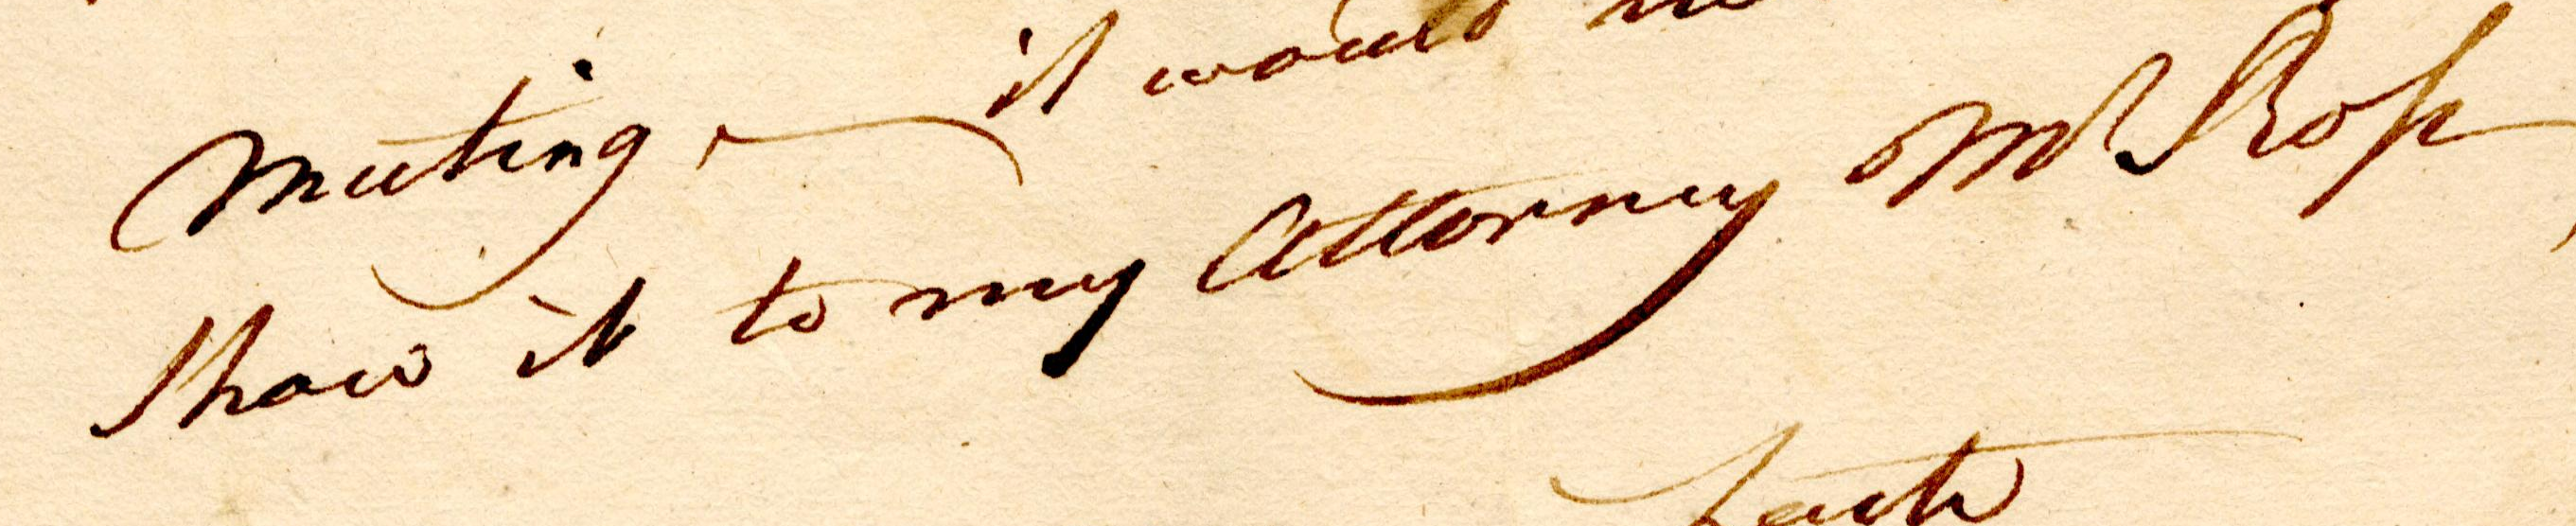shew it to my attorney M^r Ross
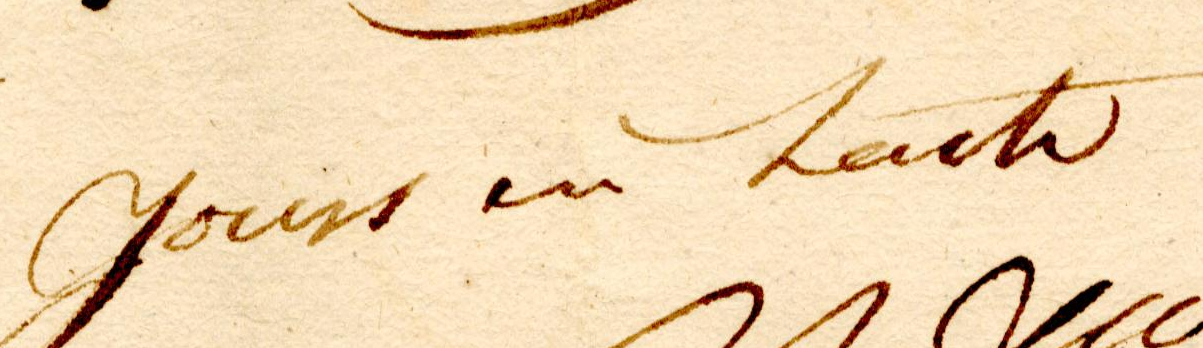Yours in haste
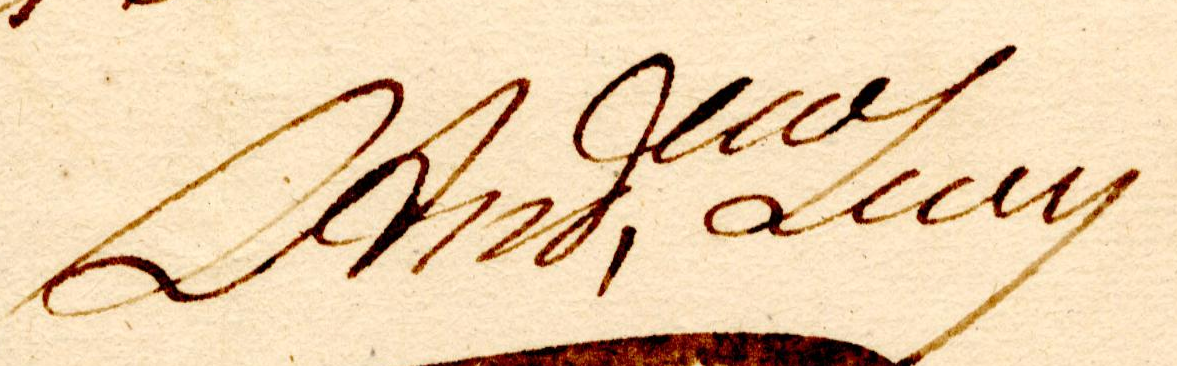L And^rew Levy
